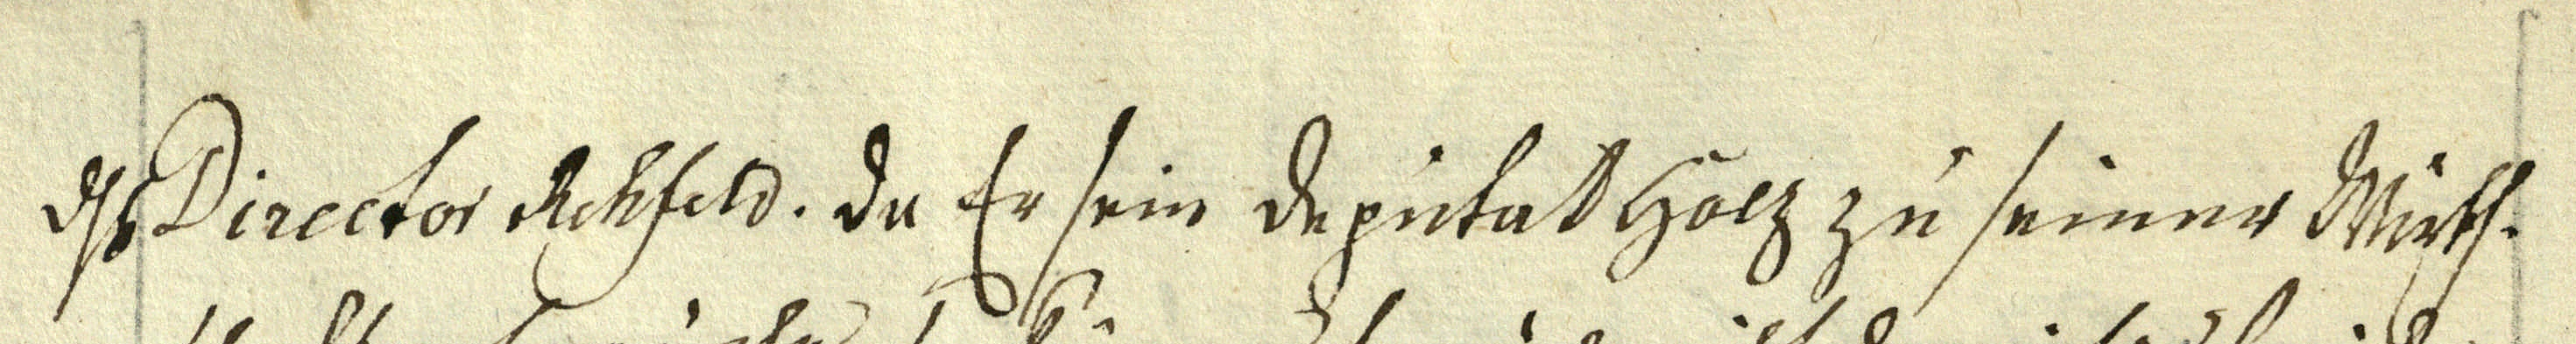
dh Director Rehfeld. Da Er sein Deputat Holz zu seiner Wirth¬
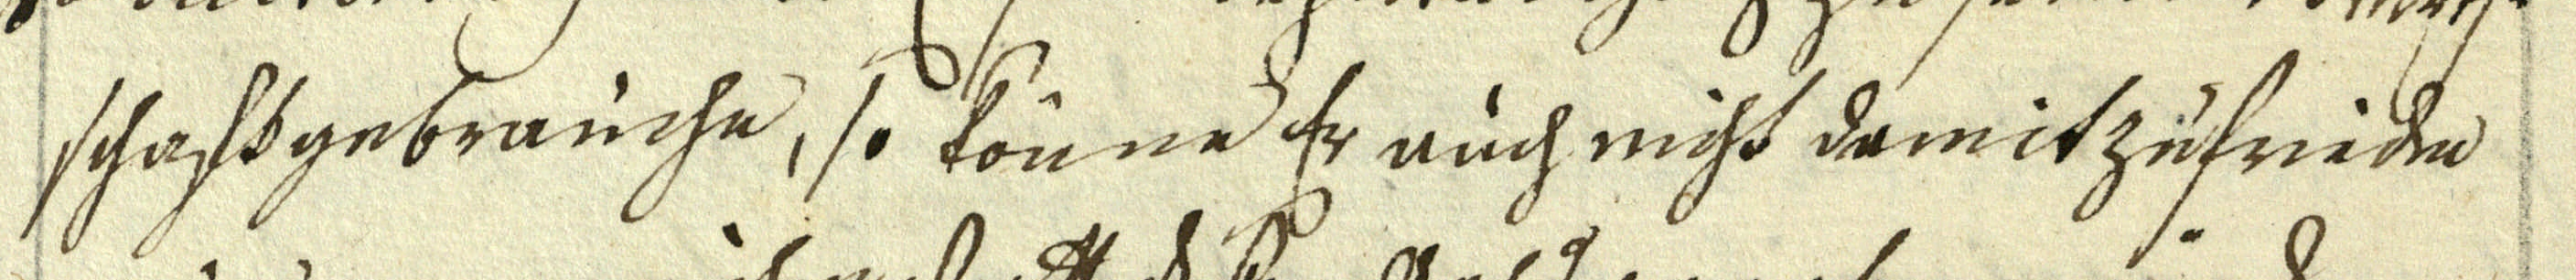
schaft gebrauche, so könne Er auch nicht damit zufrieden
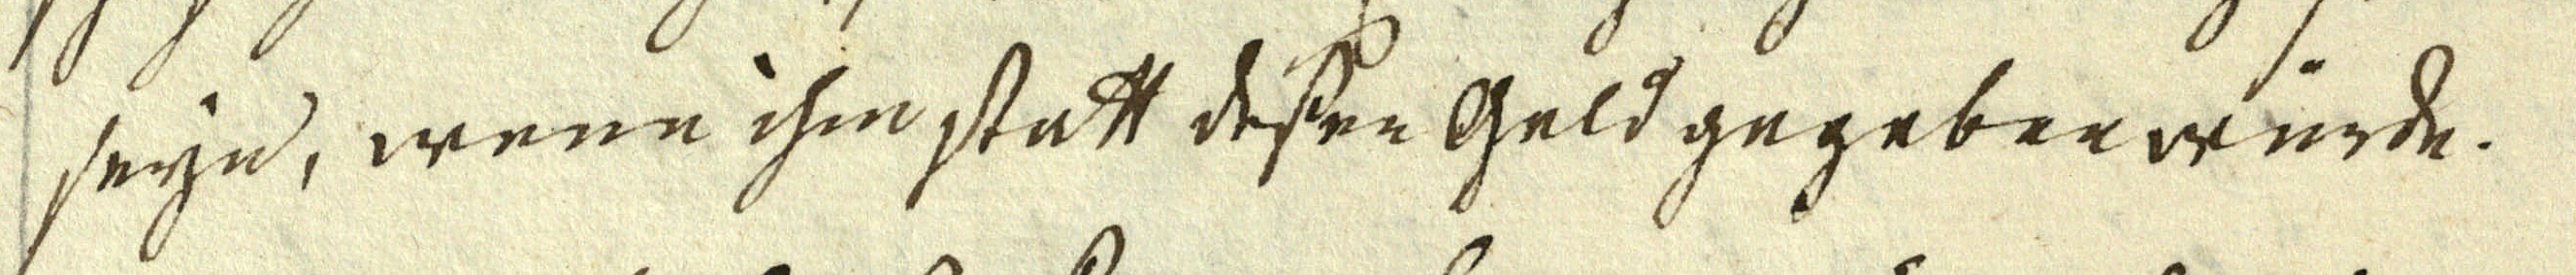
seÿn, wenn ihm statt deßen Geld gegeben würde.
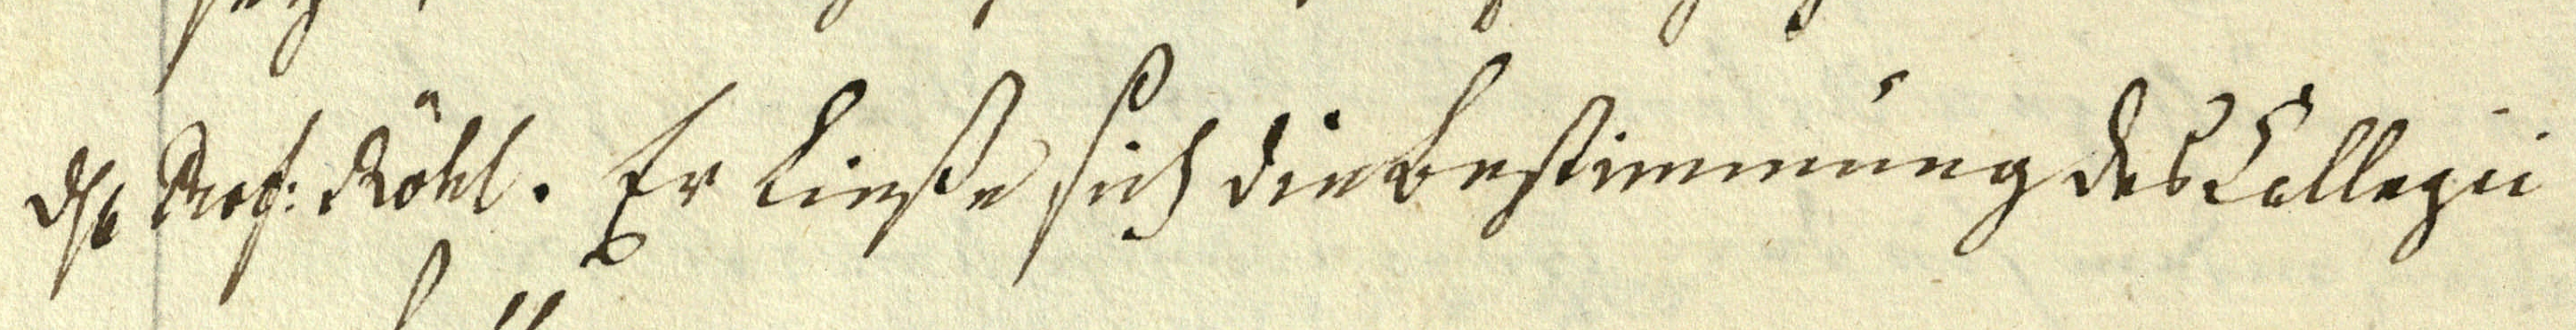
dh Prof Röhl. Er ließe sich die Bestimmung des Collegii
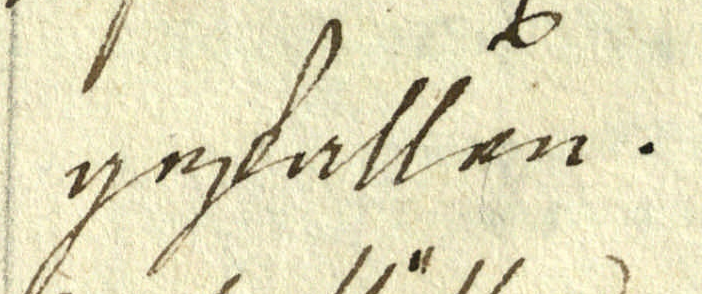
gefallen.
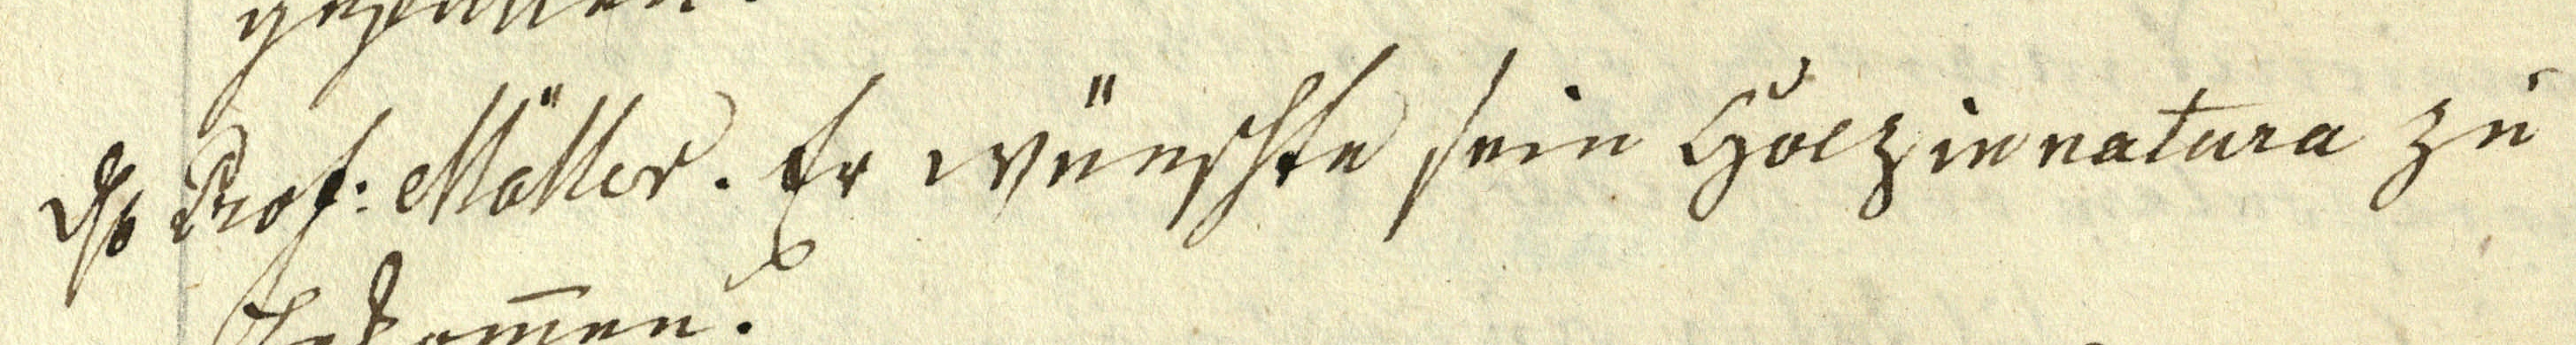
dh Prof. Möller. Er wünschte sein Holz in natura zu
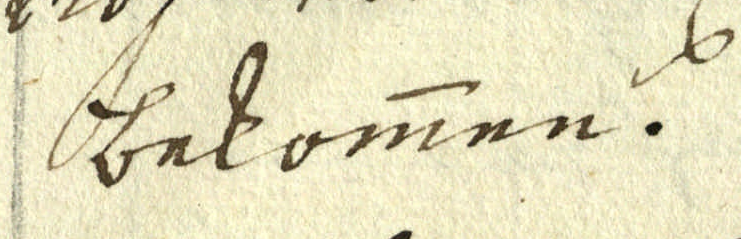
bekomen.
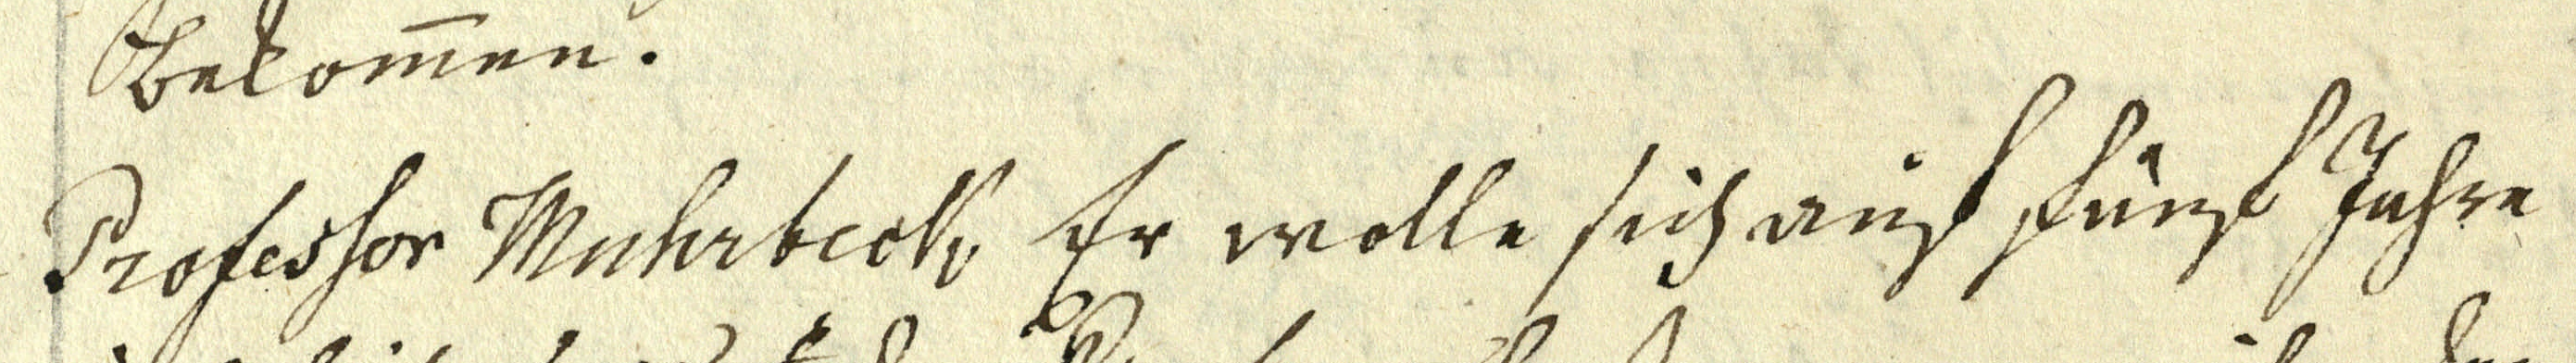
Professor Muhrbeck Er wolle sich auf für Jahre
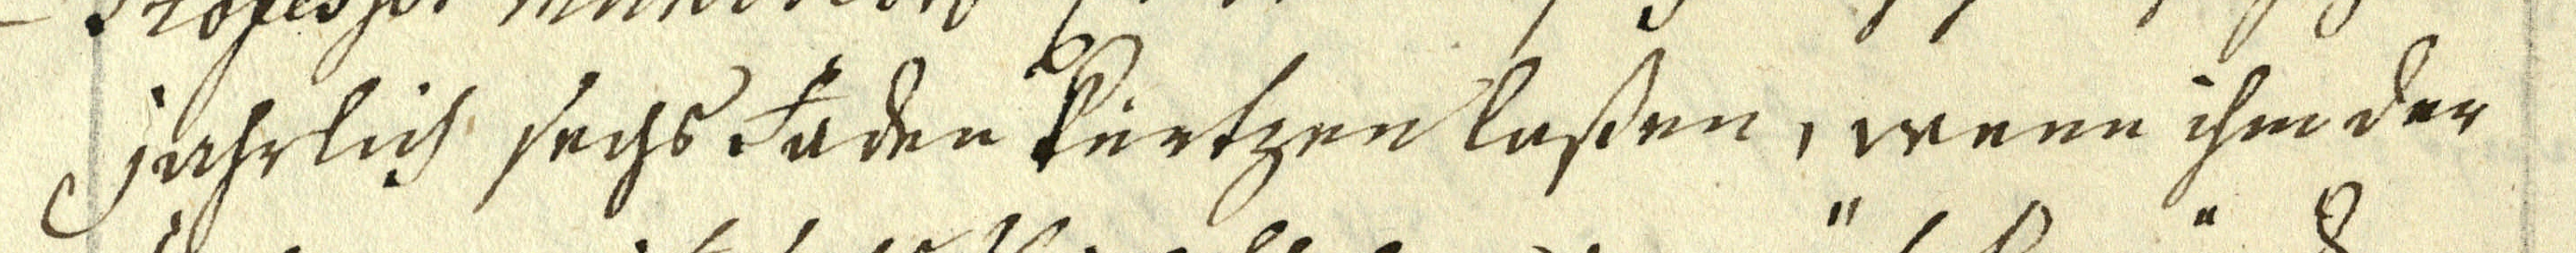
jährlich sechs Faden kürtzen laßen, wenn ihm der
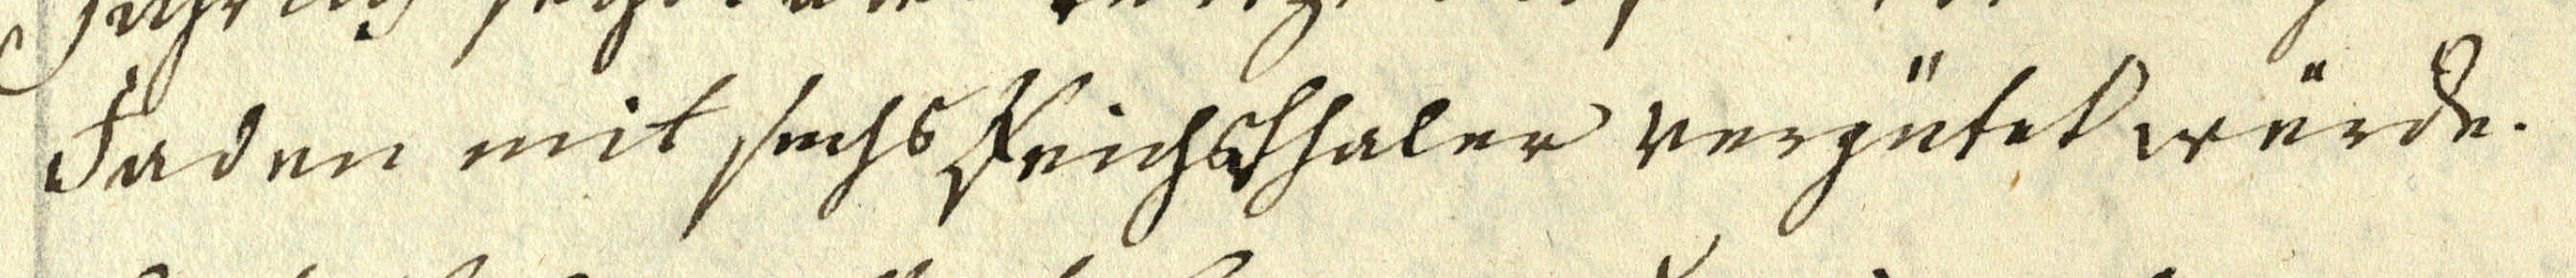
Faden mit sechs Reichsthalern vergütet würde.
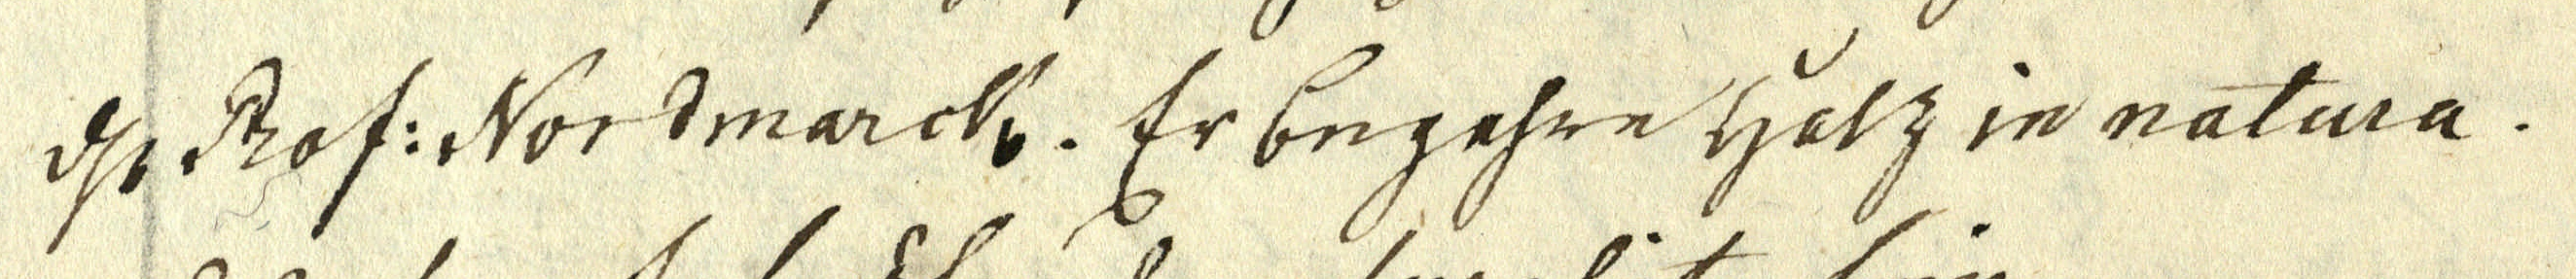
dh Prof. Nordmarck. Er begehre Holz in natura.
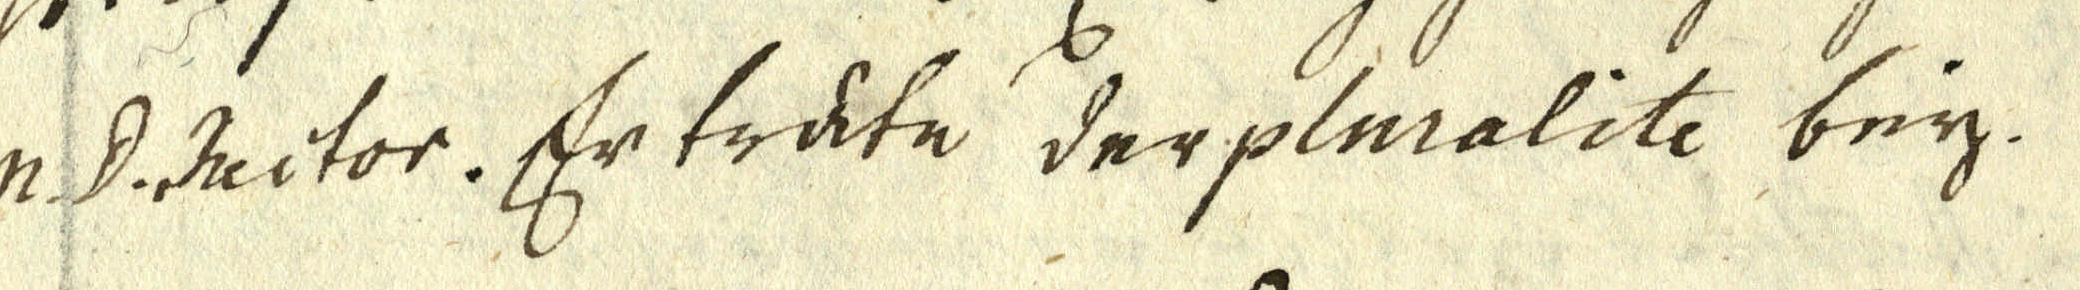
M. D. Rector. Er träte der pluralite beÿ.
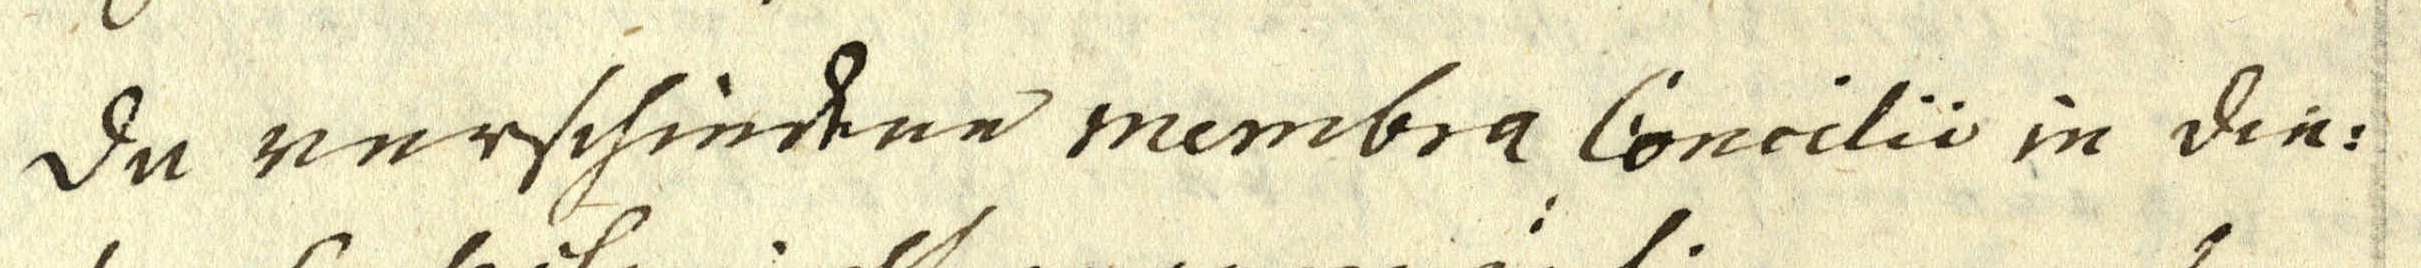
Da verschiedene membra Concilii in die¬
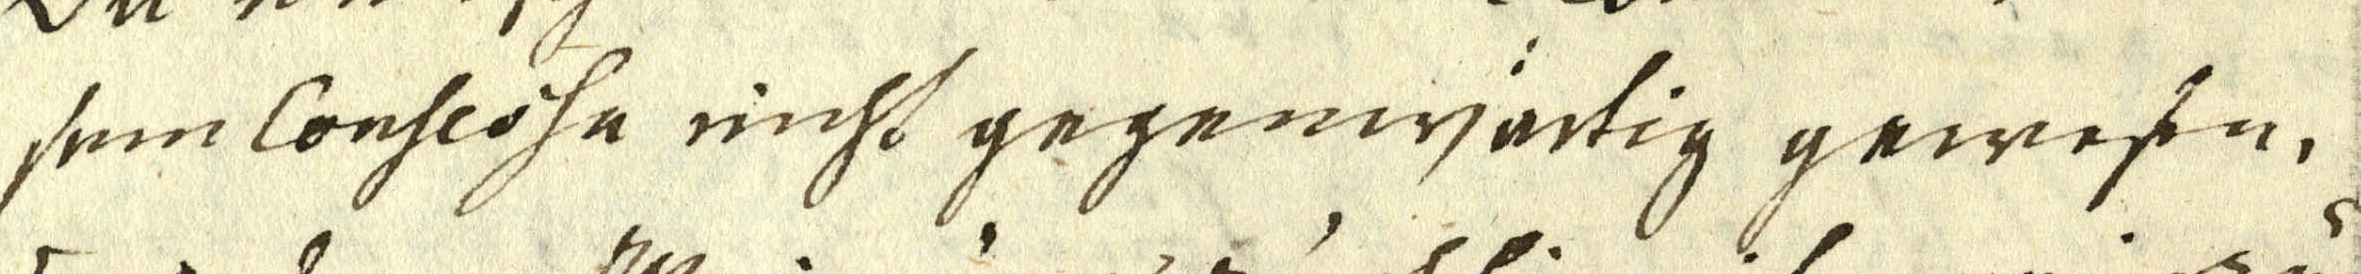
sen Consessu nicht gegenwärtig gewesen,
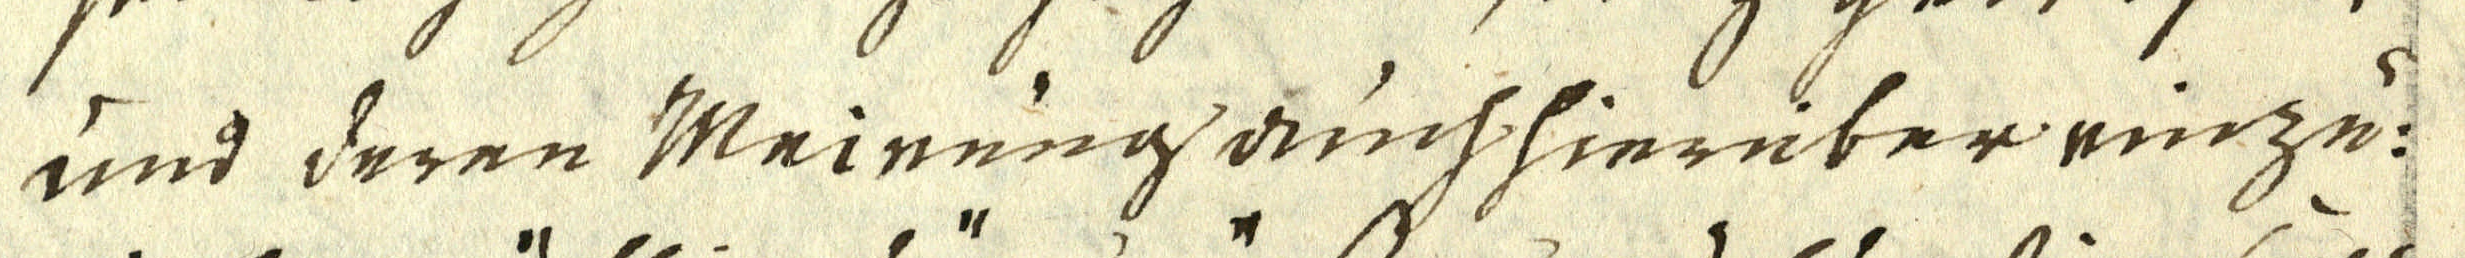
und deren Meinung auch hierüber einzu¬
